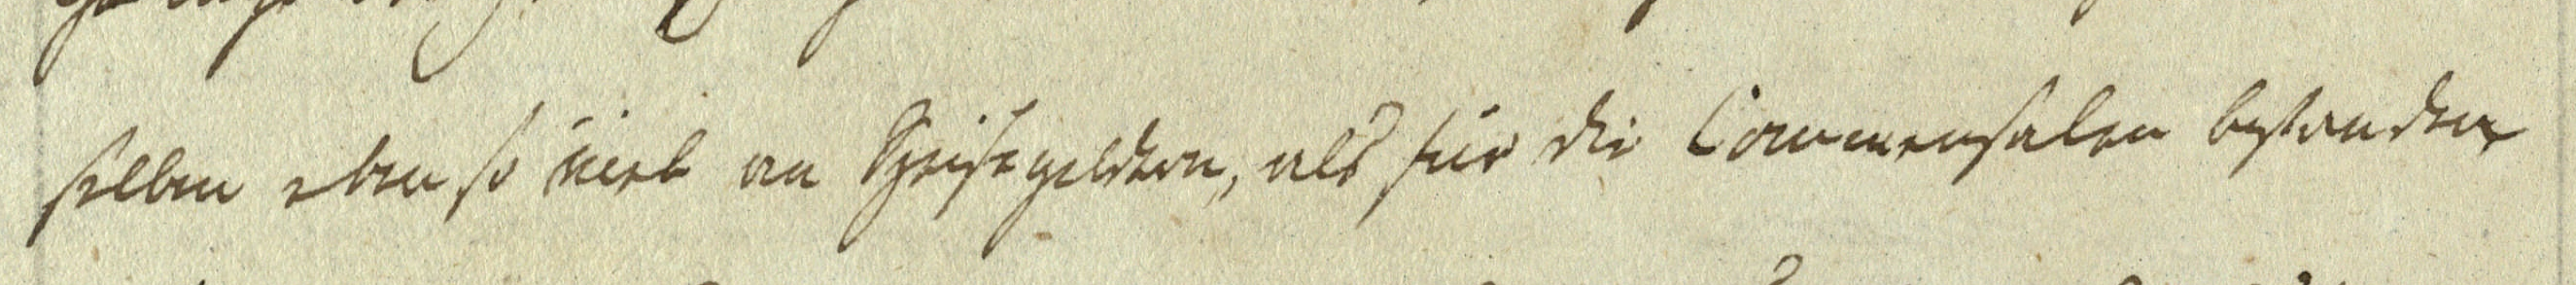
selben eben so viel an Speisegeldern, als für die Commensalen bestanden
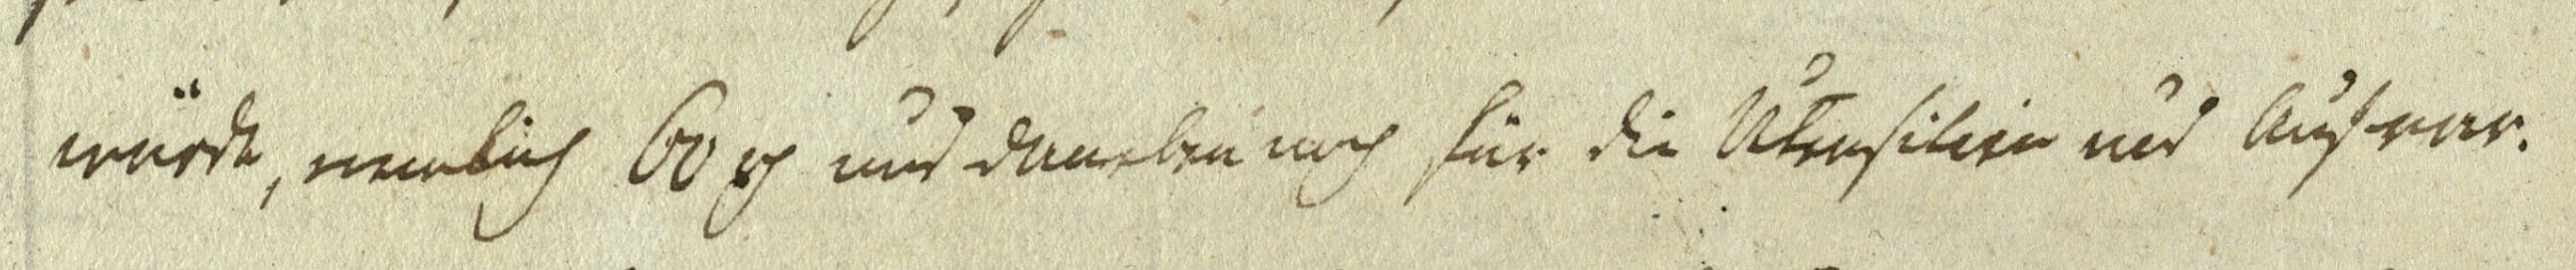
würde, nemlich 60 rt und daneben noch für die Utensilien und Aufwar¬
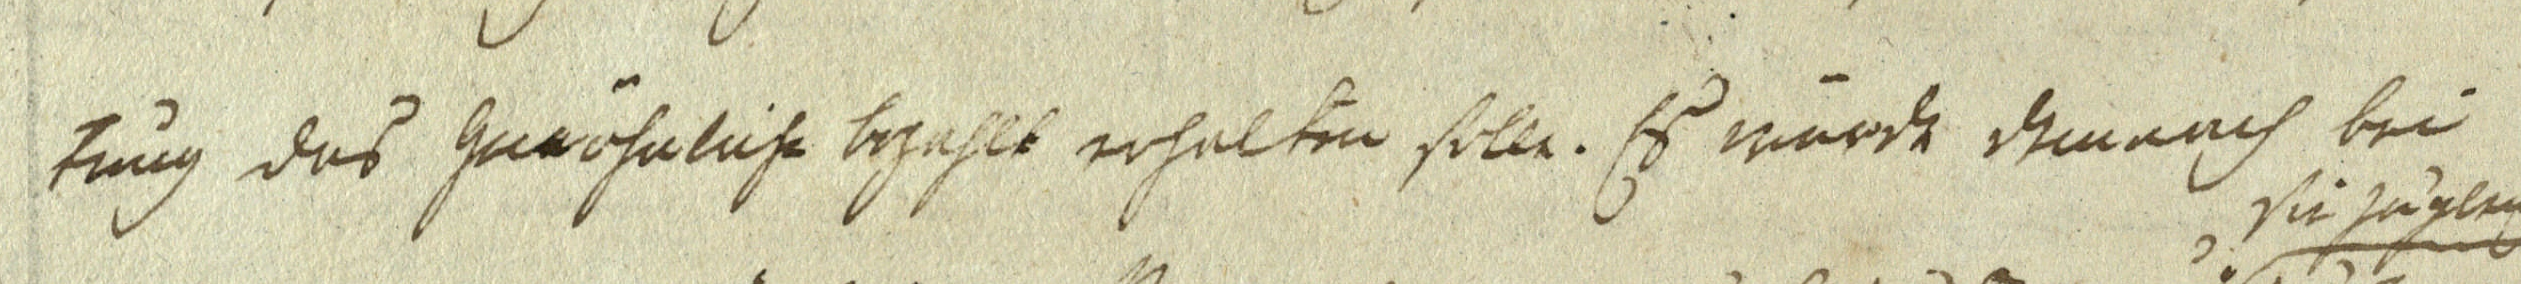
tung das Gewöhnliche bezahlt erhalten solle. Es würde demnach bei
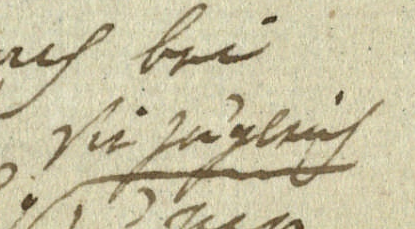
sie zugleich
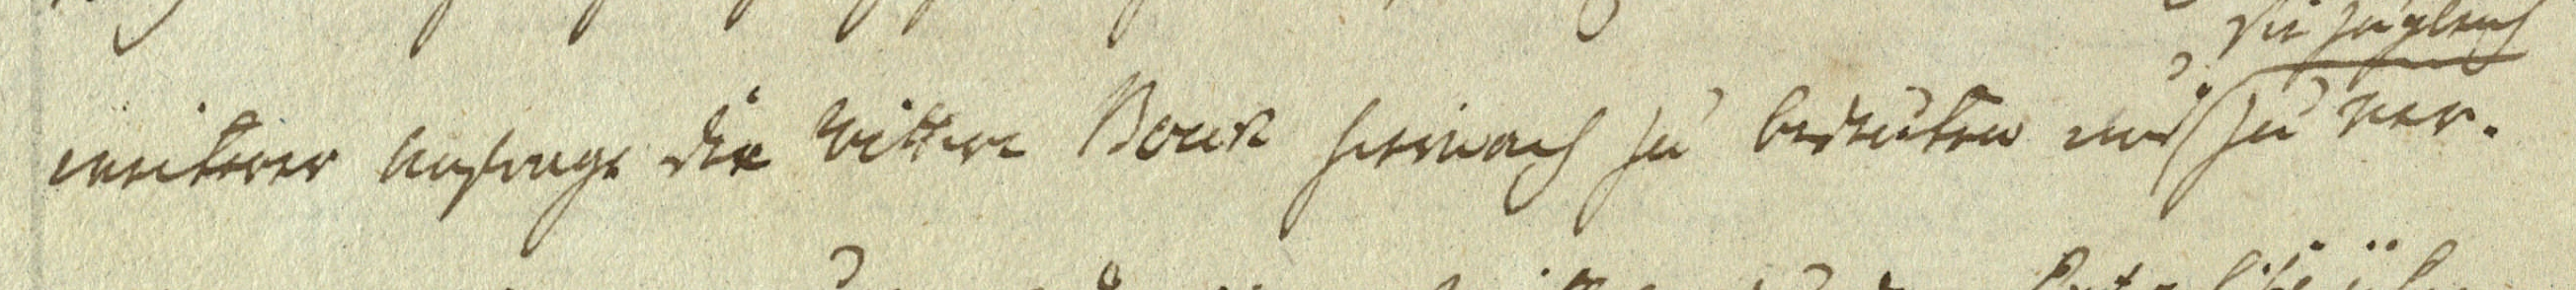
weiterer Anfrage der Wittwe Boeck hiernach zu bedeuten und zu ver¬
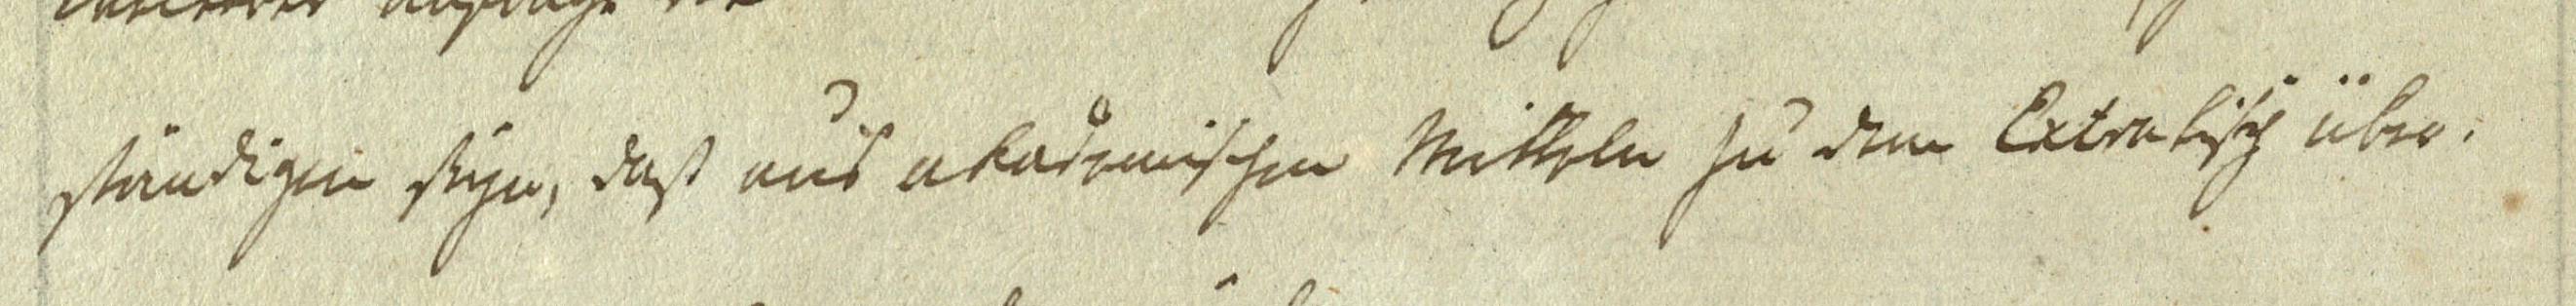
ständigen seÿn, daß aus akademischen Mitteln zu dem Extratisch über¬
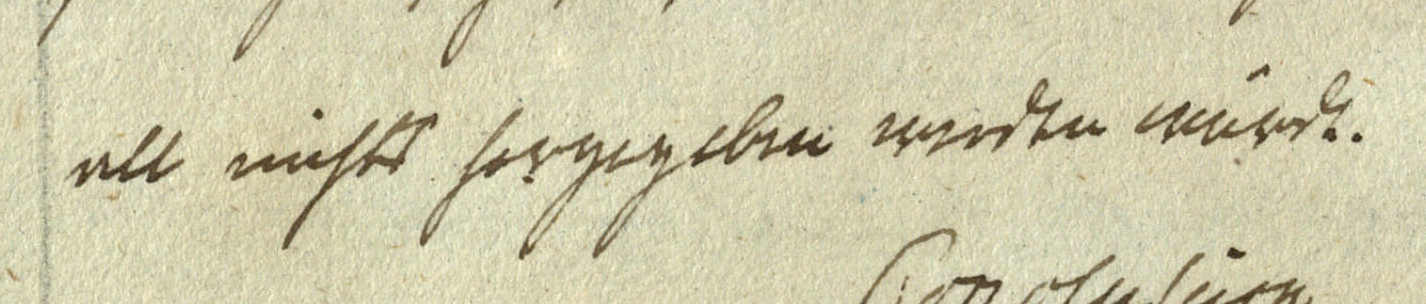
all nichts hergegeben werden würde.
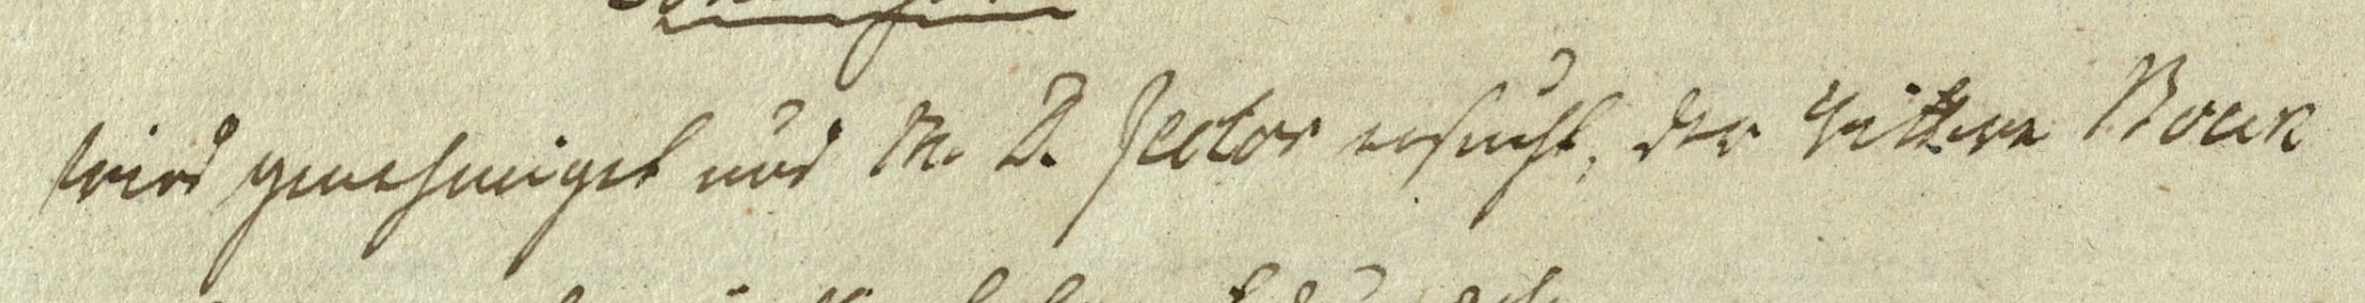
Wird genehmiget und M. D. Rector ersucht, der Wittwe Boeck
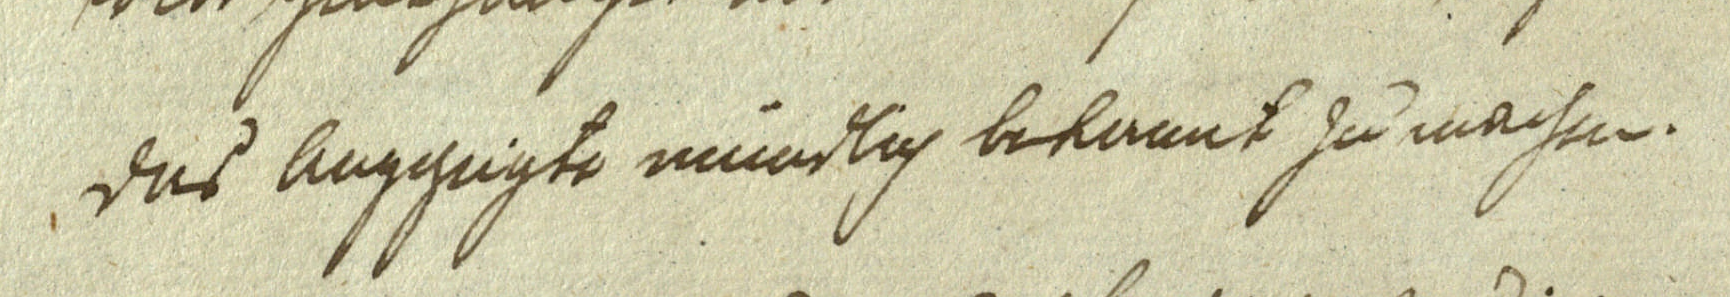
das Angezeigte mündlich bekannt zu machen.
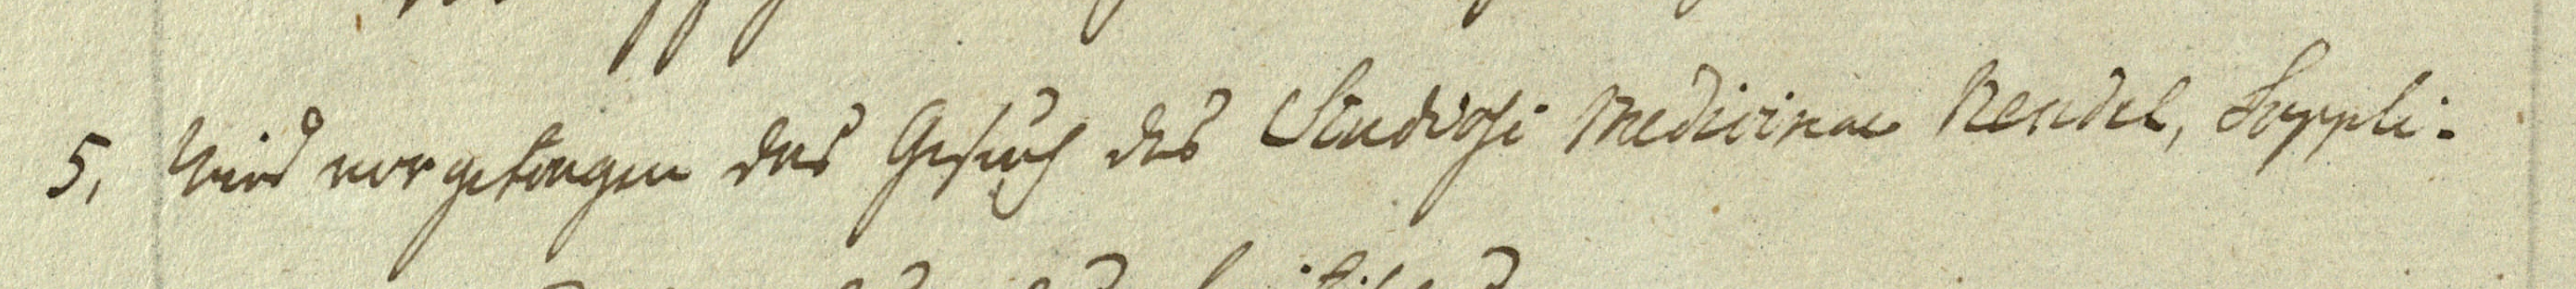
5, Wird vorgetragen das Gesuch des Studiosi Medicinae Nendel, Suppli¬
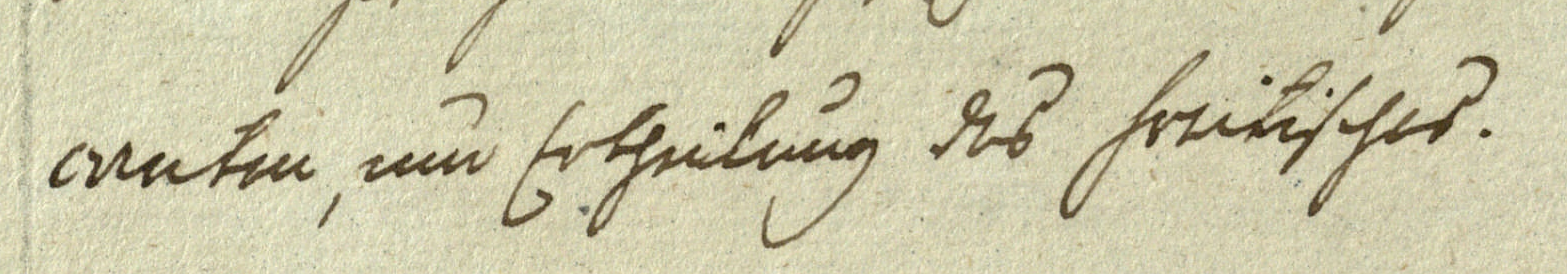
canten um Ertheilung des Freitisches.
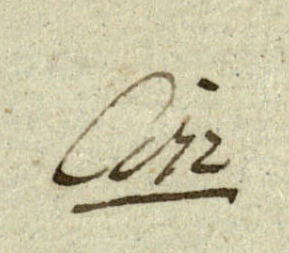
Con
